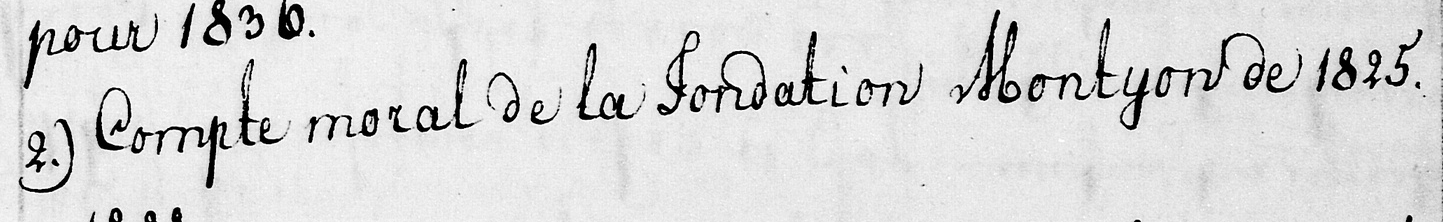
2.) Compte moral des la Fondation Montyon de 1825.
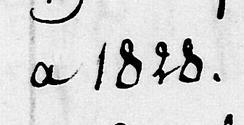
a 1830.
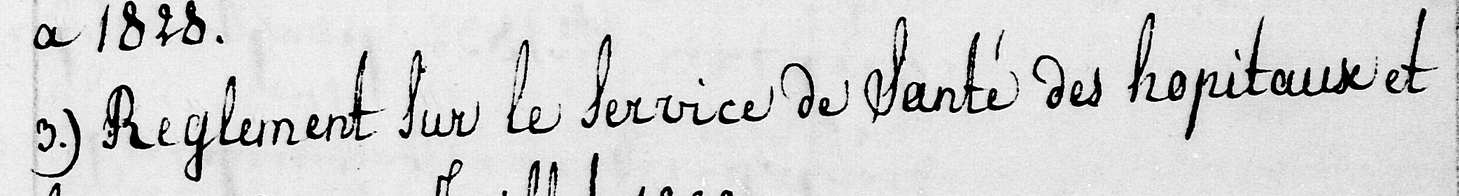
3.) Reglement Sur le Service de Santé des hopitaux et
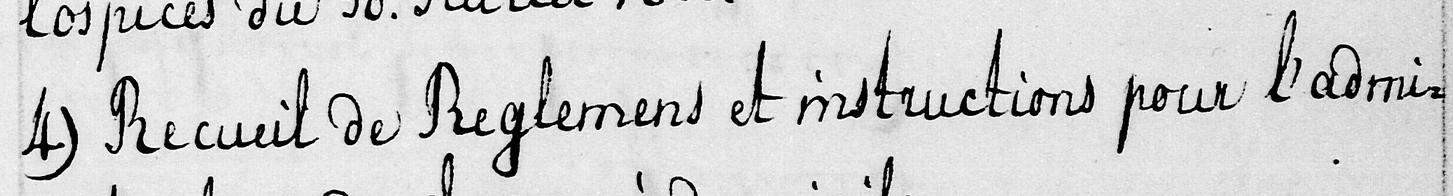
4.) Recueil de Reglemens et instructions pour l’admi¬
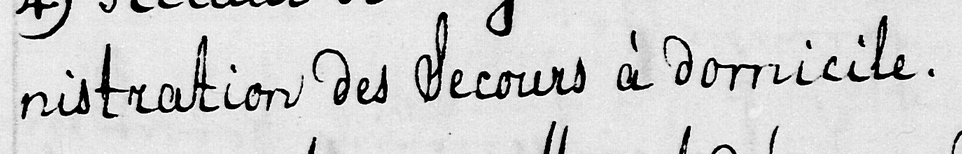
nistration des Secours à domicile.
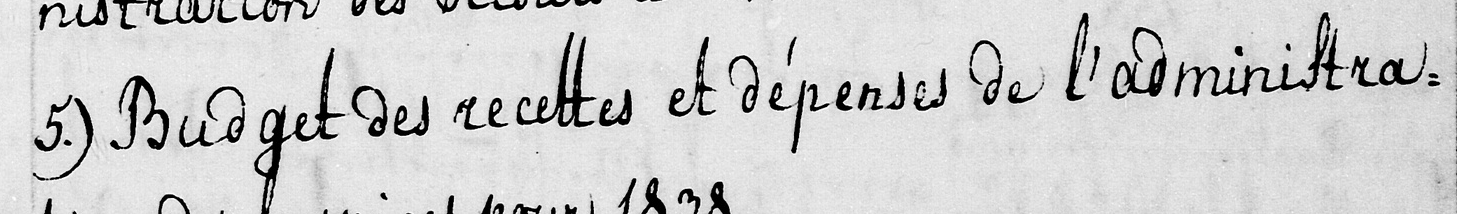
5.) Budget des recettes et dépenses de l’administra¬
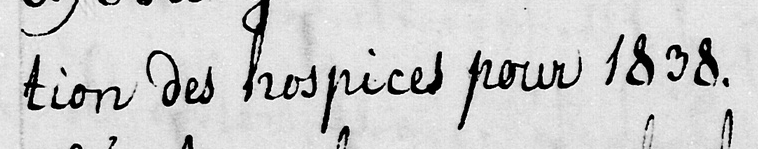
tion des hospices pour 1838.
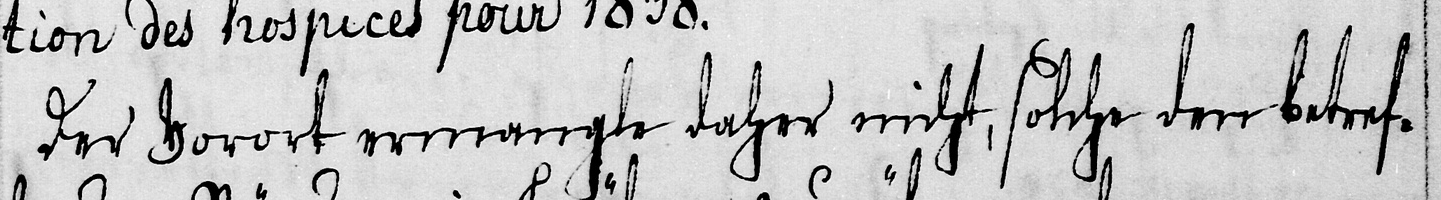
Der Vorort ermangle daher nicht, solche den betref¬
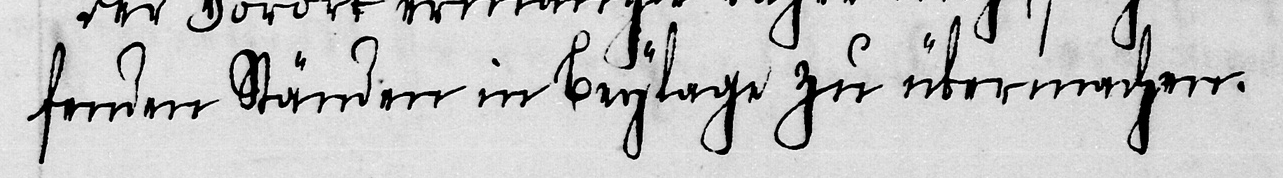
fenden Ständen in Beylage zu übermachen.
